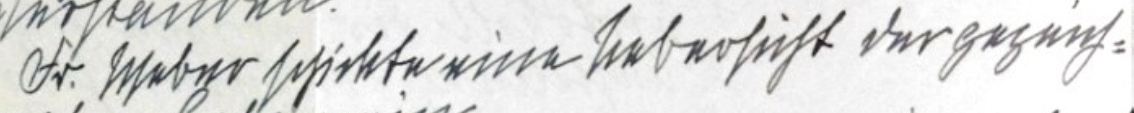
Fr, Weber schickte eine Übersucht der geig
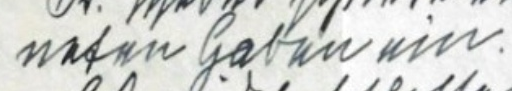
neten Gaben ein.
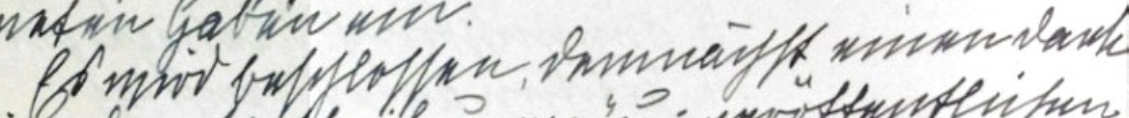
Es wird beschlossen demnächst einen Dank
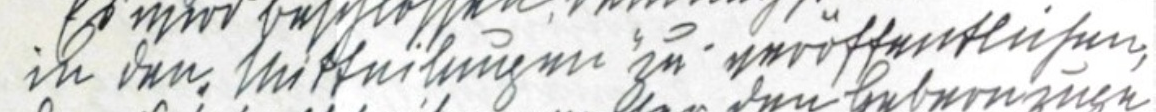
in den Mitteilungen zu veröffentlichen
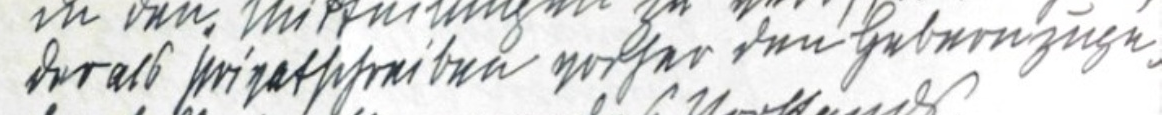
der als Privatschreiben vorher den Gebern zuge
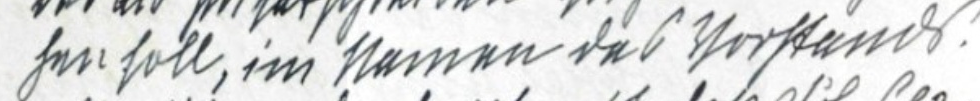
hen soll, im Namen des Vorstands.
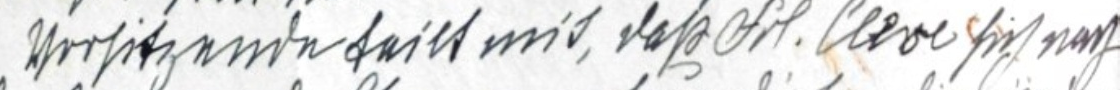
Vorsitzende teilt mit, daß Frl. Cleve sich nach
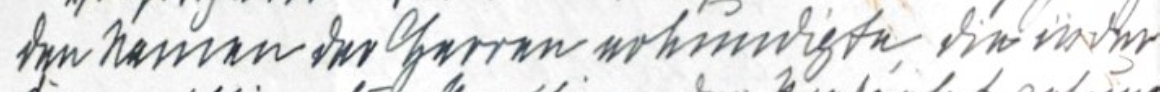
dem Namen der Herren erkundigte, die in der
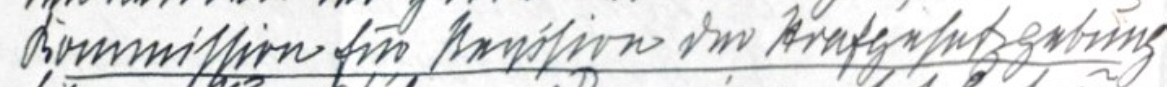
Kommistion für Revision der Strafgesetzgebung
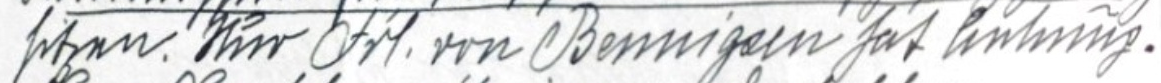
sitzen. Nur Frl. von Bennigsen hat Antmug
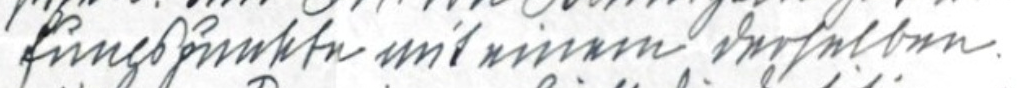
fungs guntete mit einem derselben
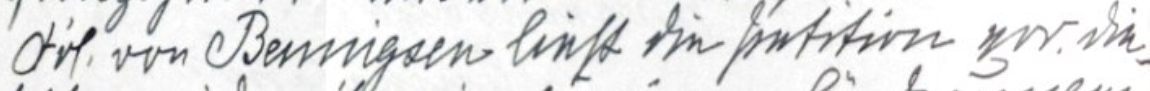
Frl. von Bennigsen liegt die Petition vor, die
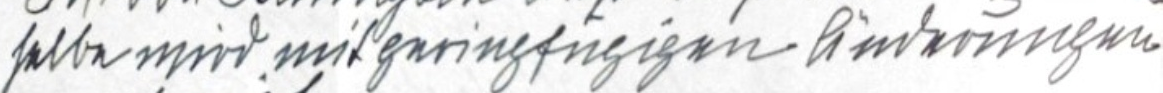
selbe wird mit geringfügigen Änderungen
